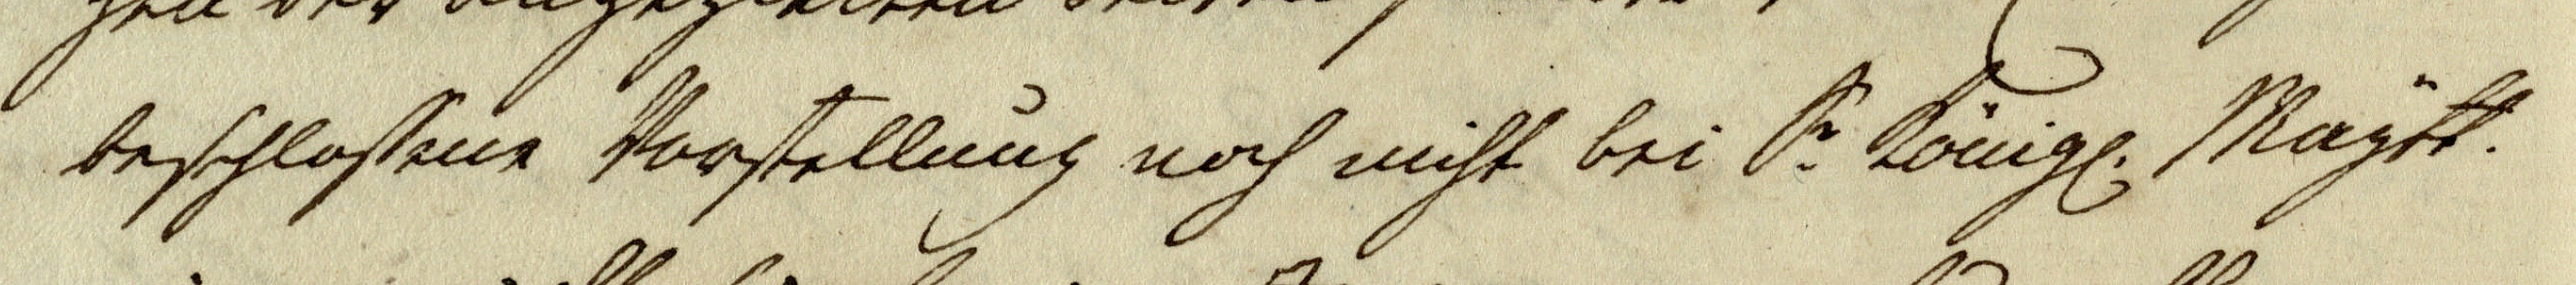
beschlossene Vorstellung noch nicht bei Sr Königl. Maÿtt.
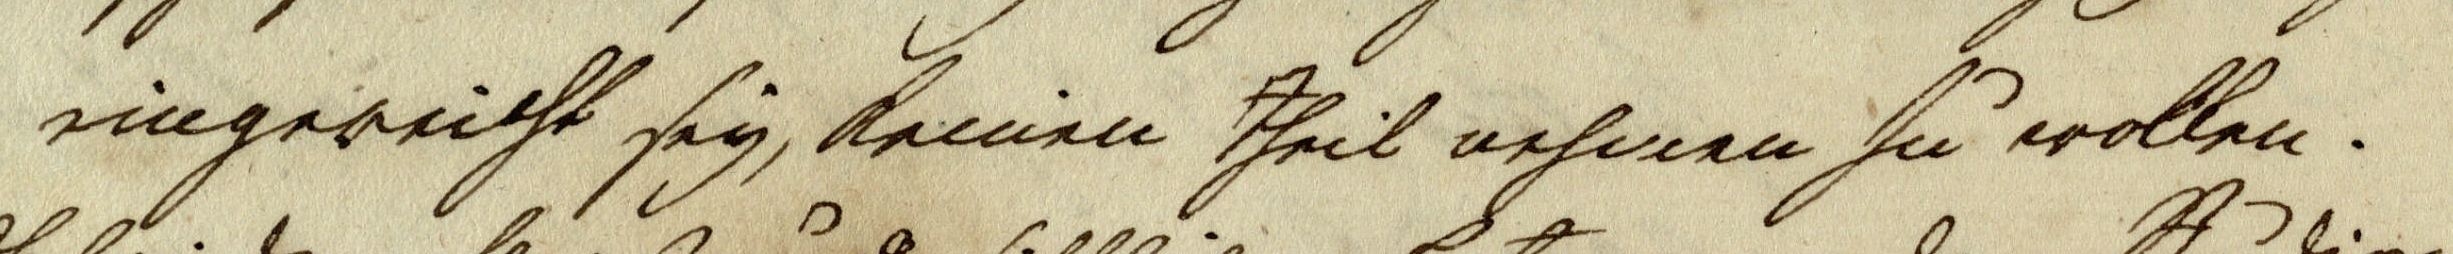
eingereicht seÿ, keinen Theil nehmen zu wollen.
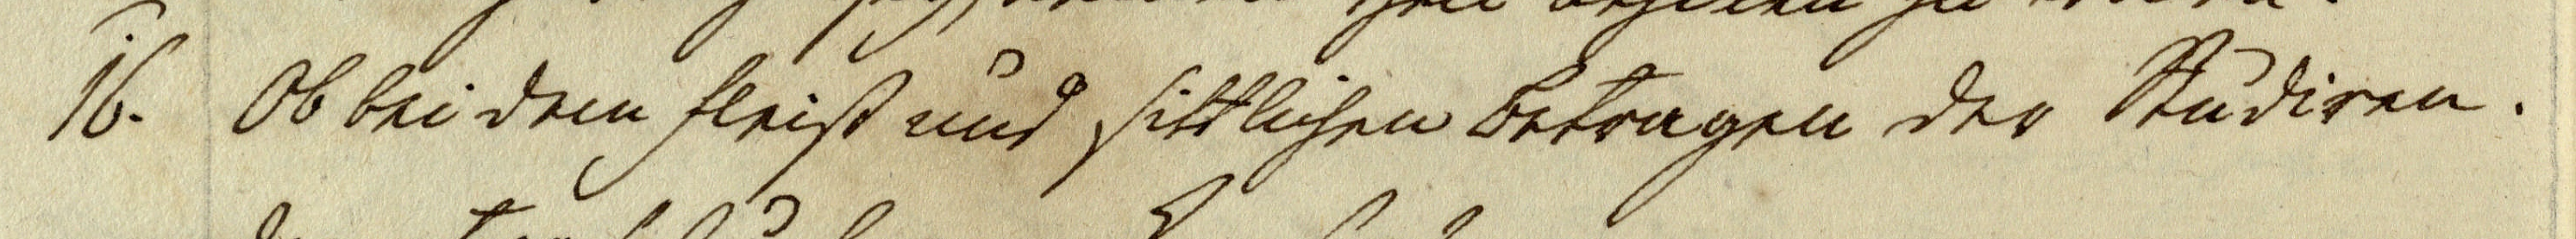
16. Ob bei dem Fleiß und sittlichen Betragen der Studiren¬
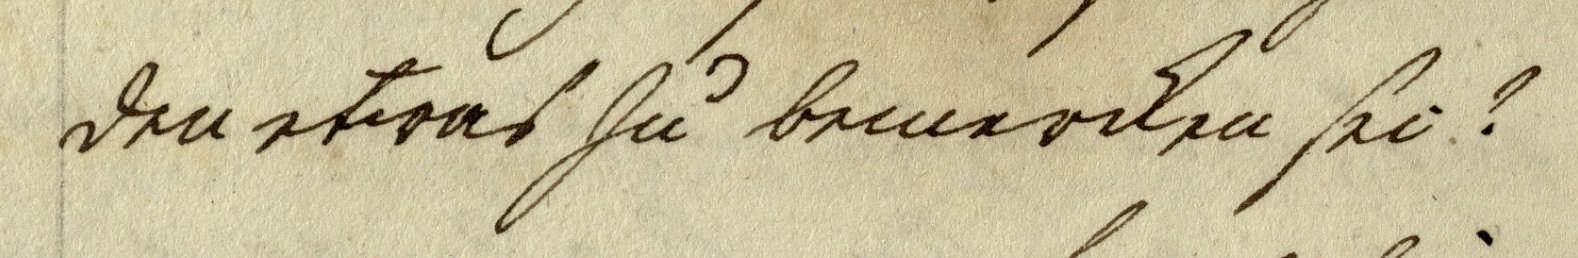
den etwas zu bemercken sei?
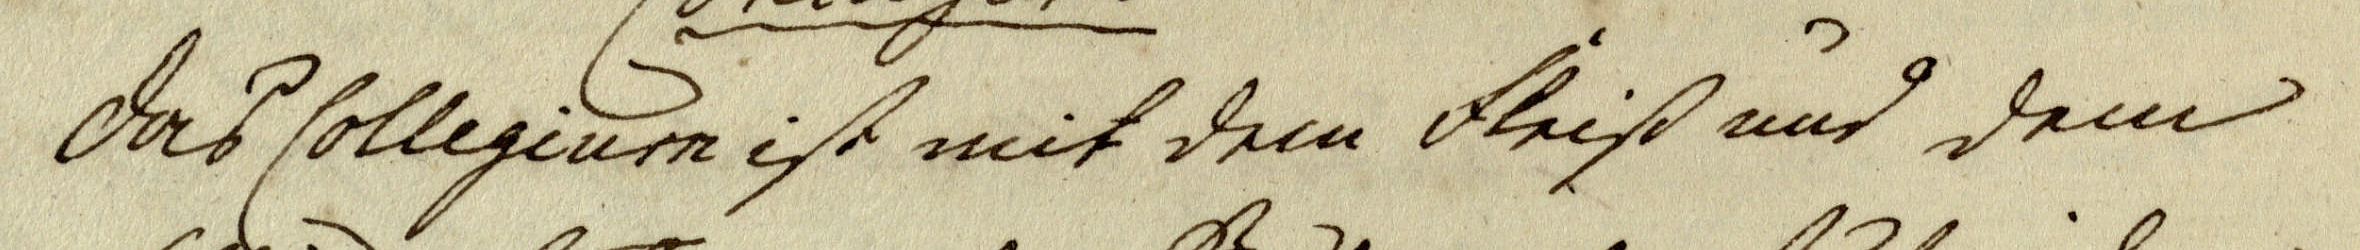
Das Collegium ist mit dem Fleiß und dem
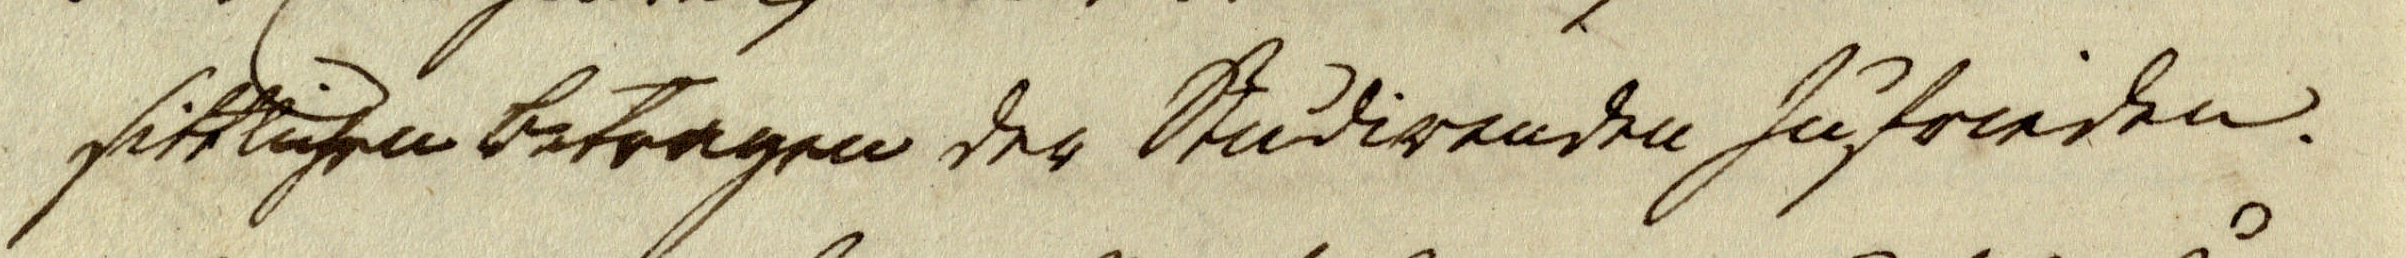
sittlichen Betragen der Studirenden zufrieden.
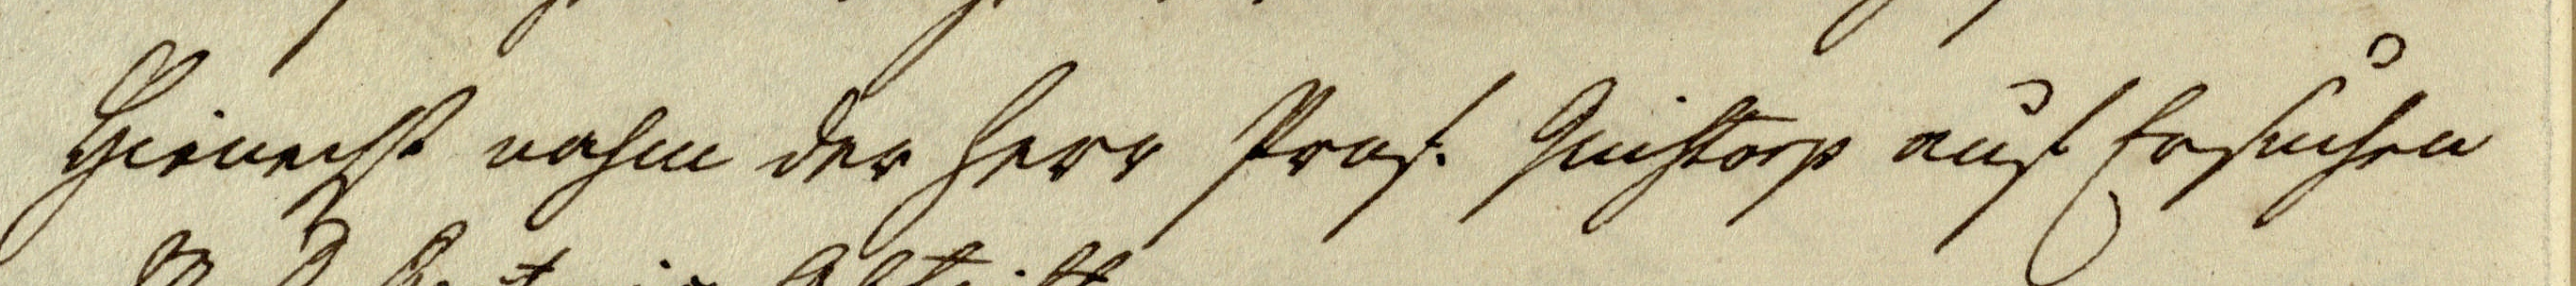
Hienechst nahm der Herr Prof. Quistorp auf Ersuchen
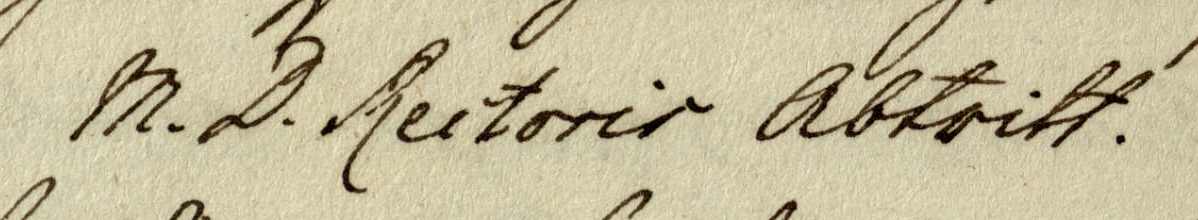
M. D. Rectoris Abtritt.
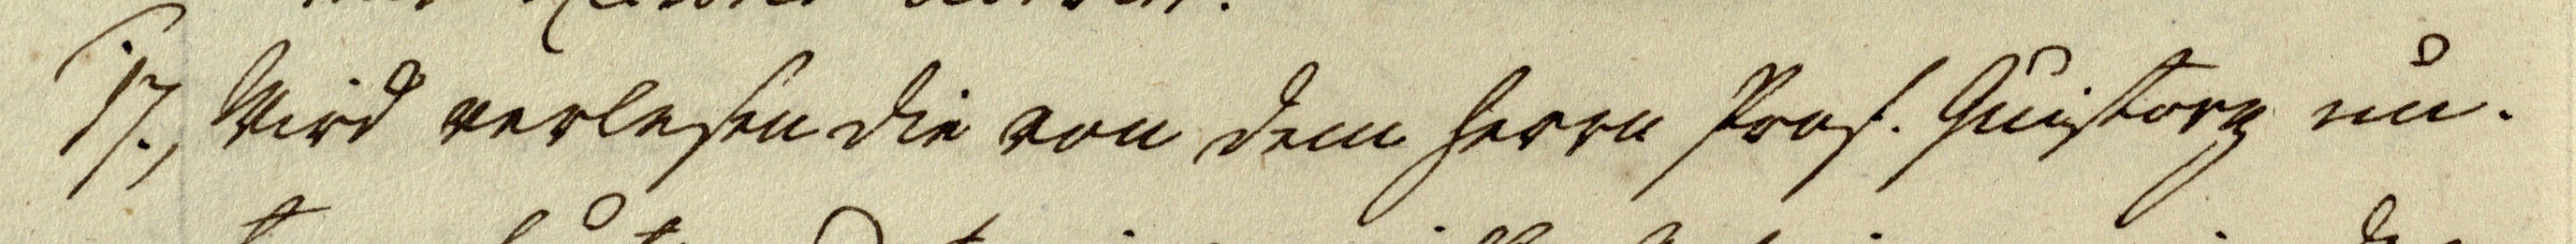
17., Wird verlesen die von dem Herrn Prof. Quistorp un¬
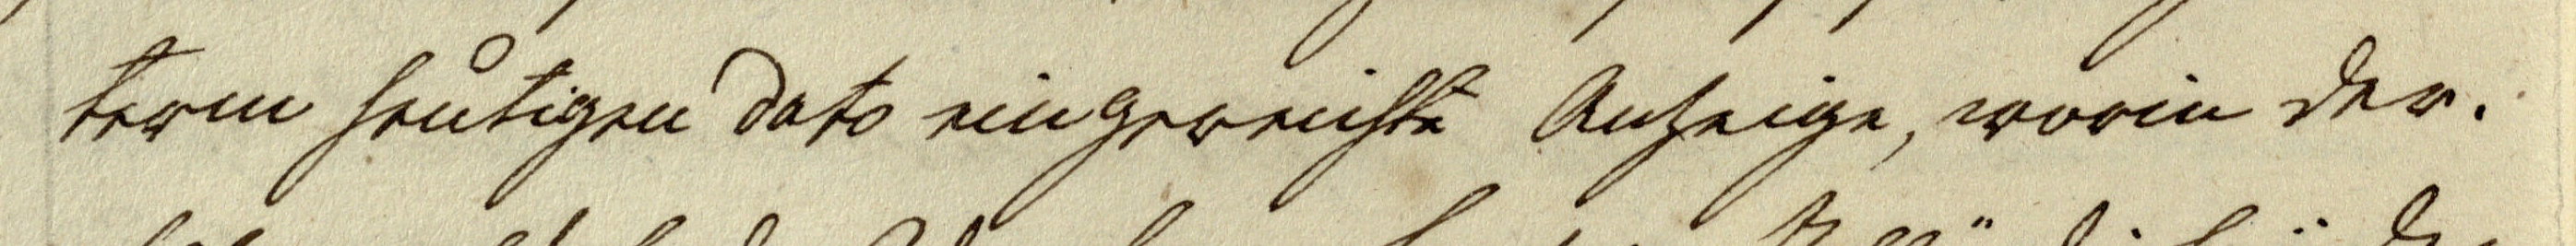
term heutigen dato eingereichte Anzeige, worin der¬
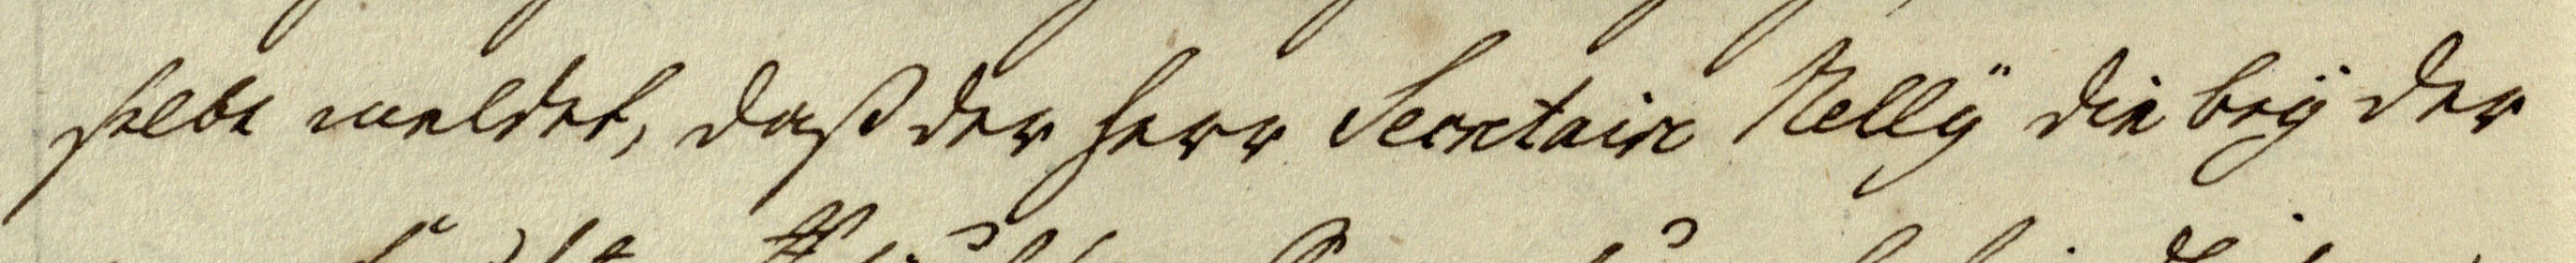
selbe meldet, daß der Herr Secetaire Nellÿ die bey der
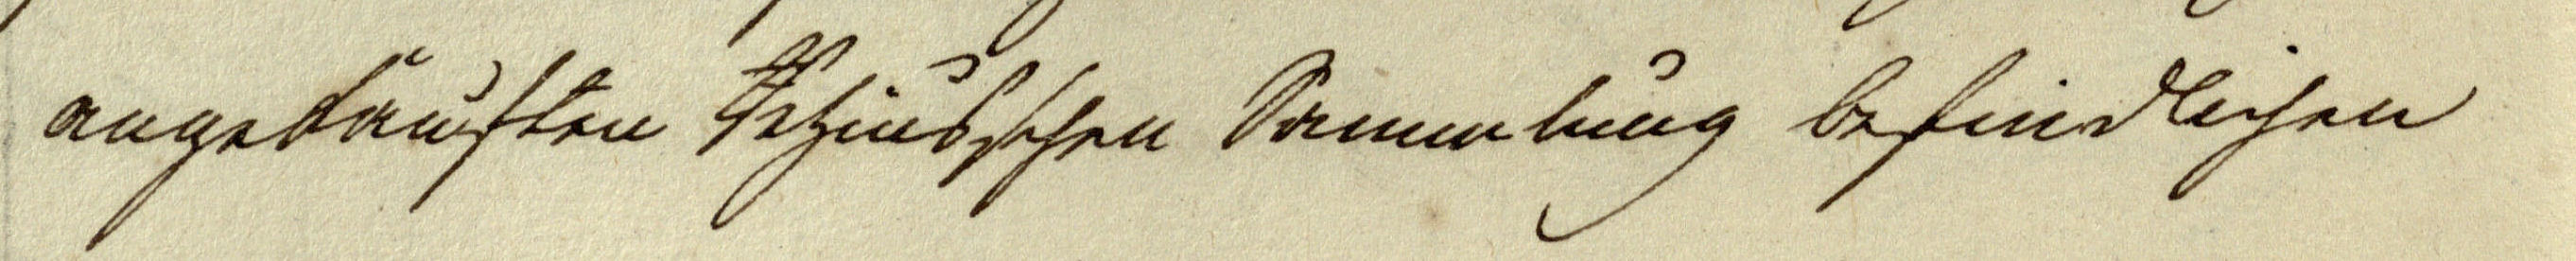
angekauften Reziusschen Sammlung befindlichen
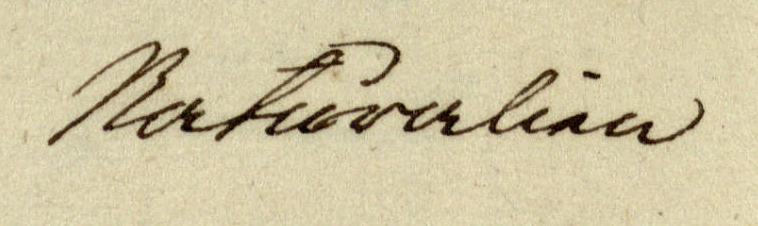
Naturalien
